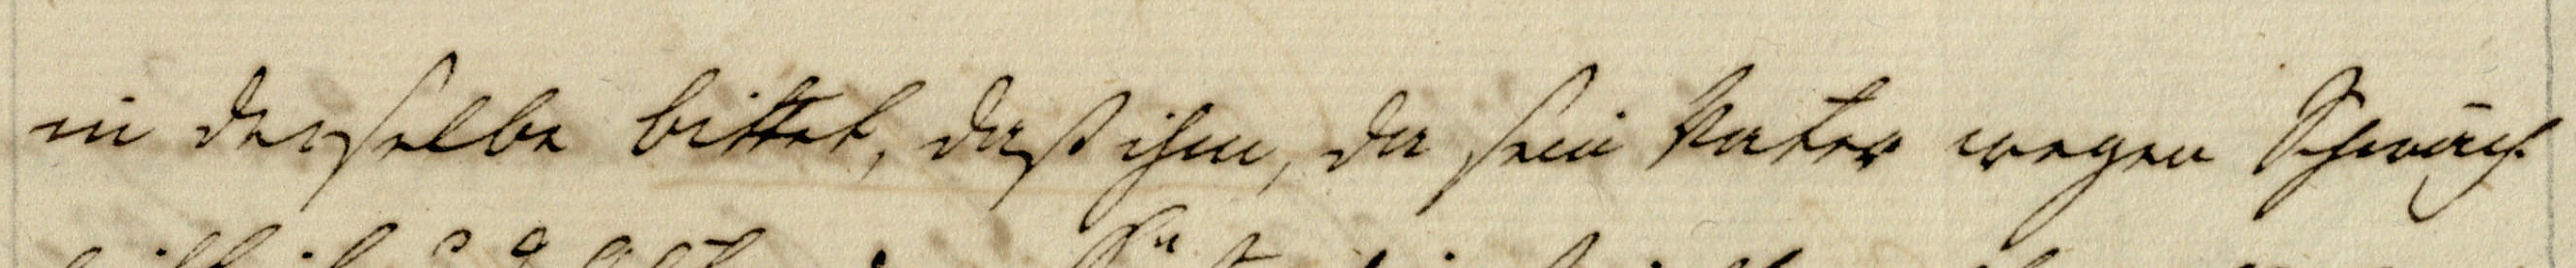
in derselbe bittet, daß ihm, da sein Vater wegen Schwäch¬
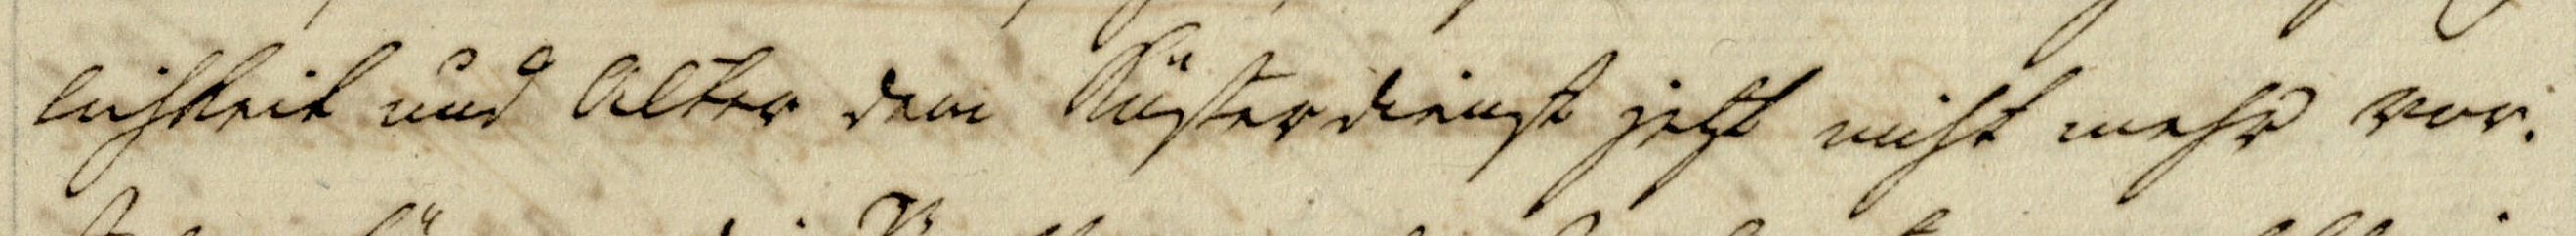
lichkeit und Alter dem Küsterdienst jetzt nicht mehr vor¬
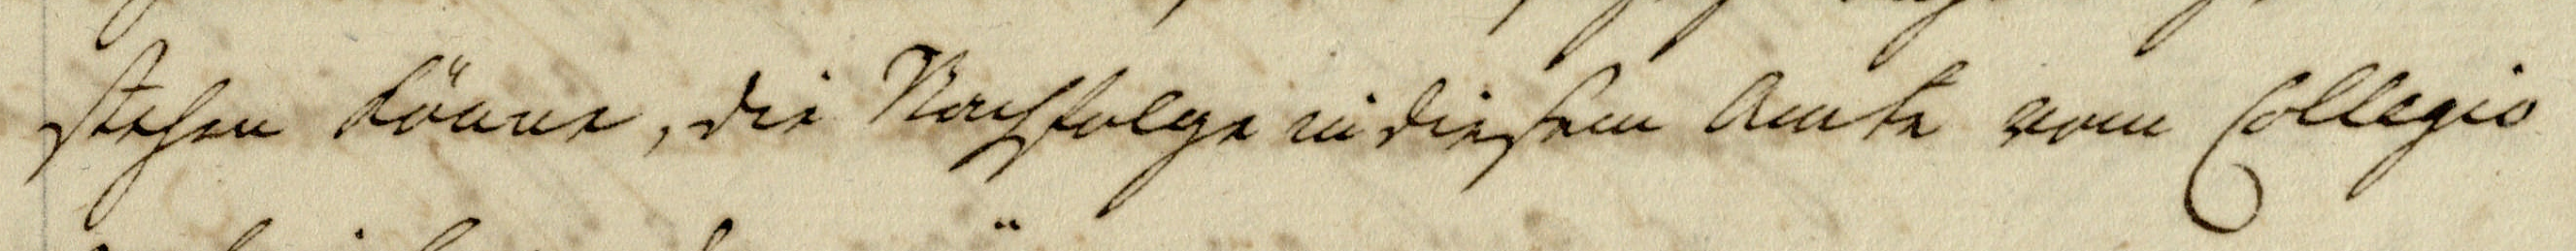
stehen könne, die Nachfolge in diesem Amte vom Collegio
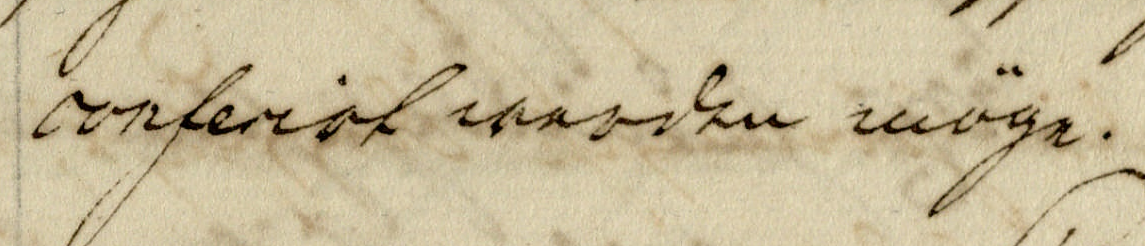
conferirt werden möge.
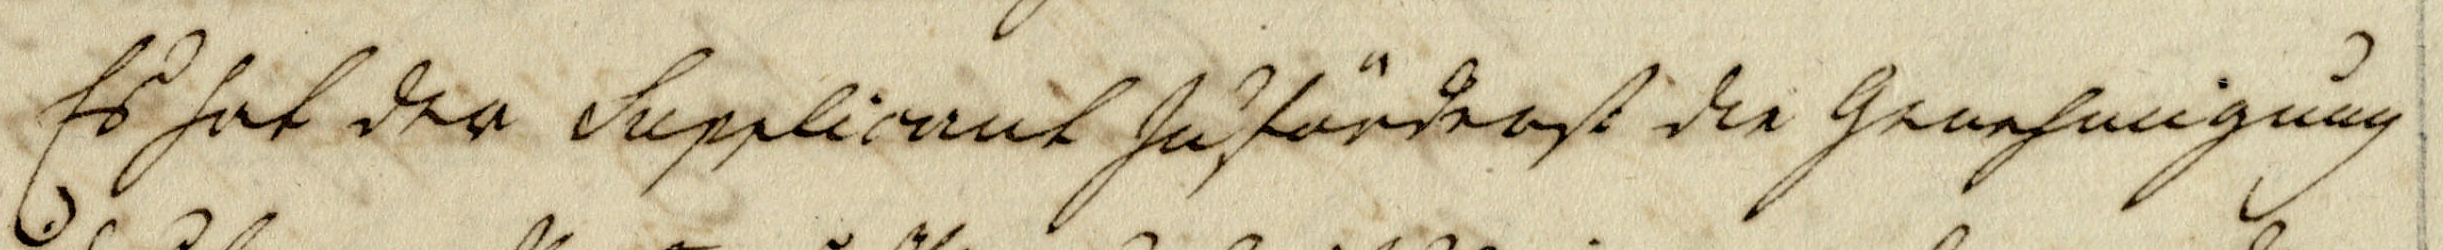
Es hat der Supplicant zuförderst die Genehmigung
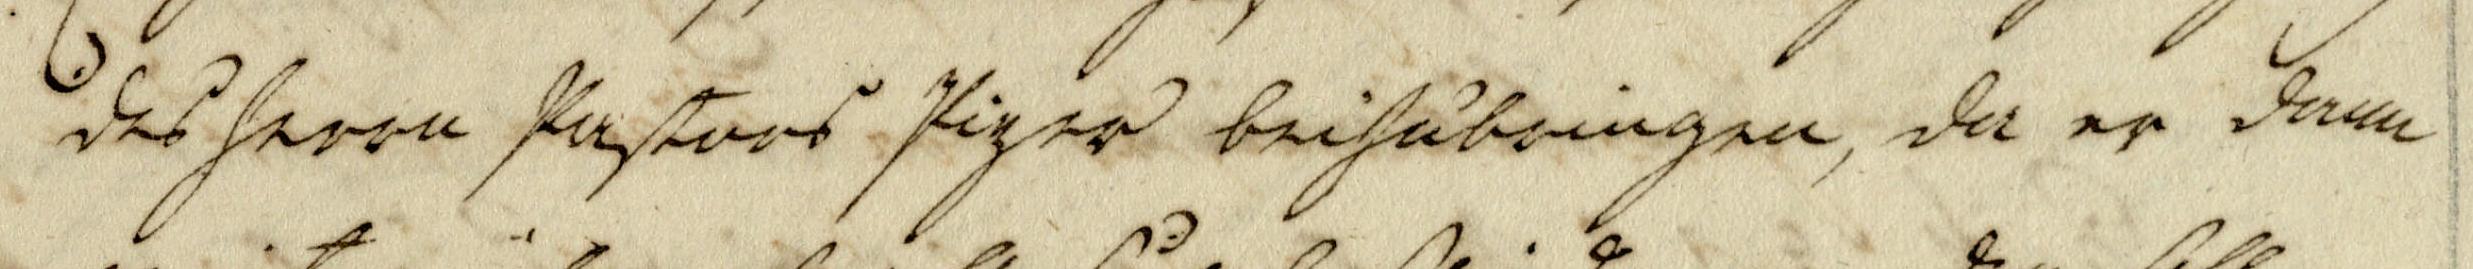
des Herrn Pastors Piper beizubringen, da er dann
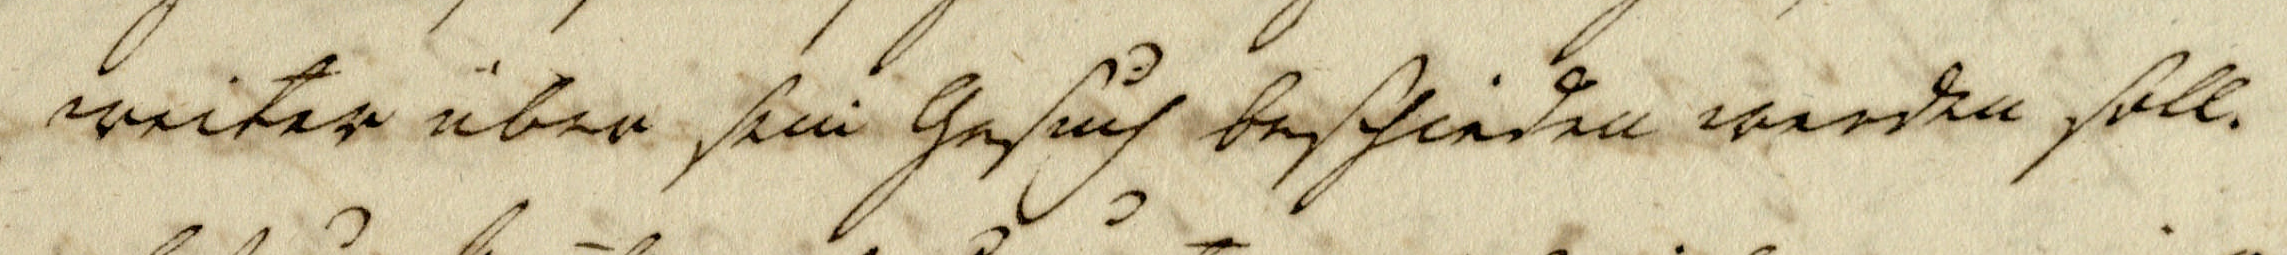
weiter über sein Gesuch beschieden werden soll.
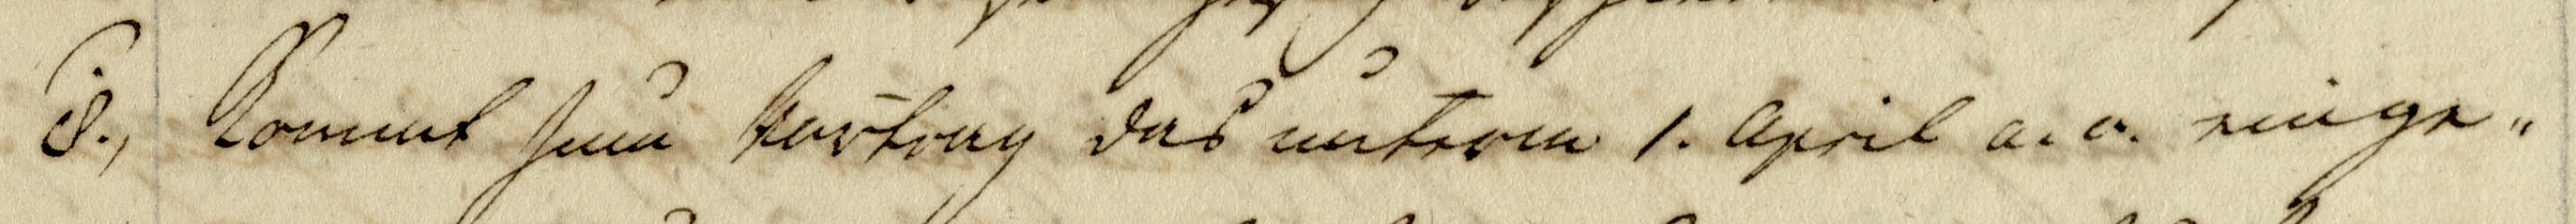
8., Kommt zum Vortrag das unterm 1. April a. c. einge¬
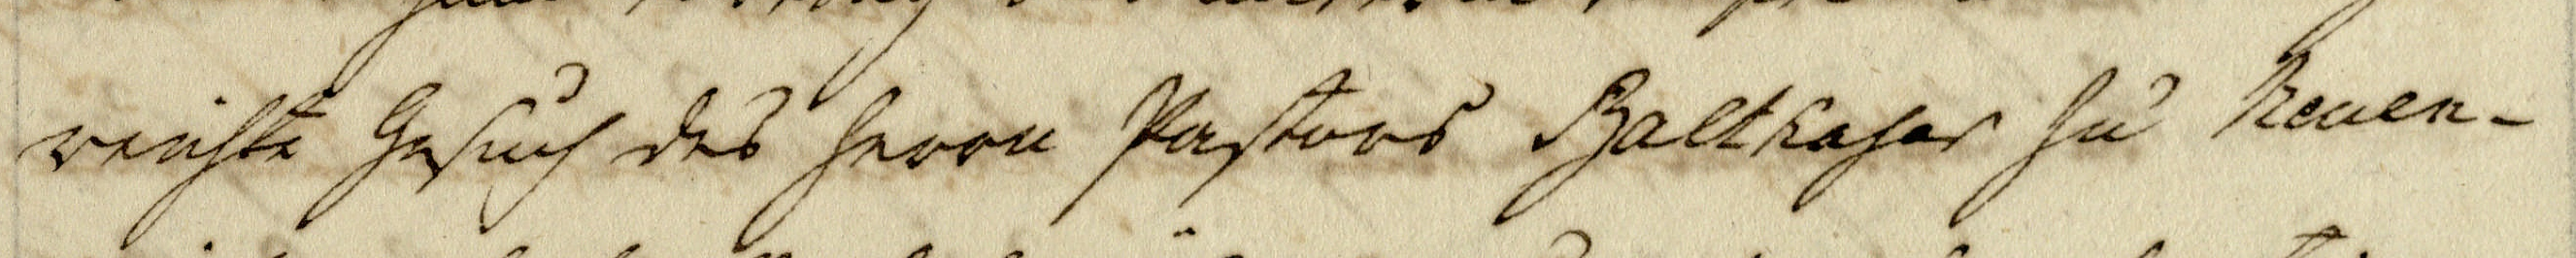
reichte Gesuch des Herrn Pastors Balthasar zu Neuen¬
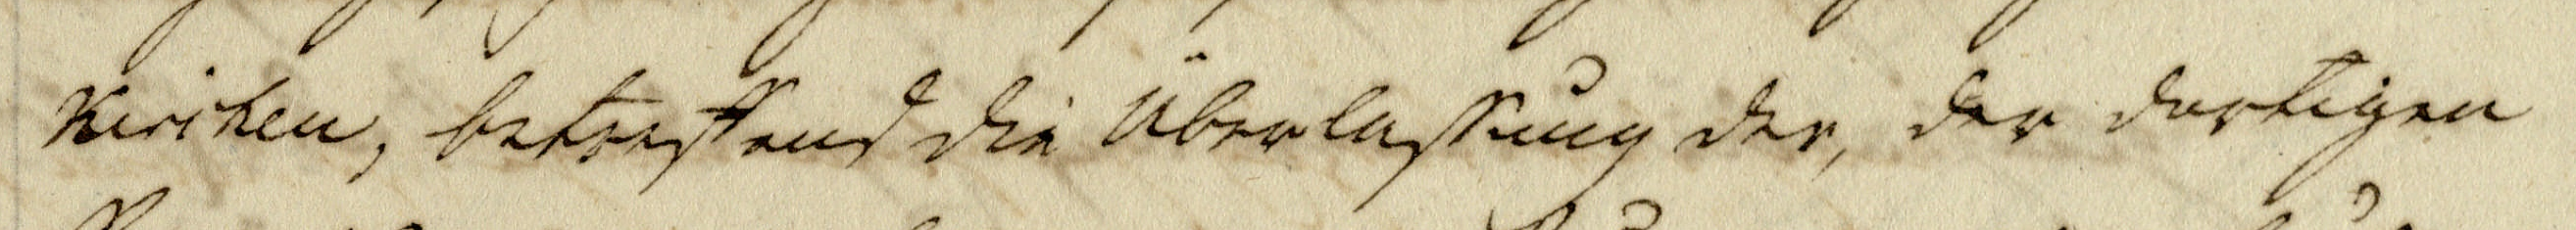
Kirchen, betreffend die Überlassung der, der dortigen
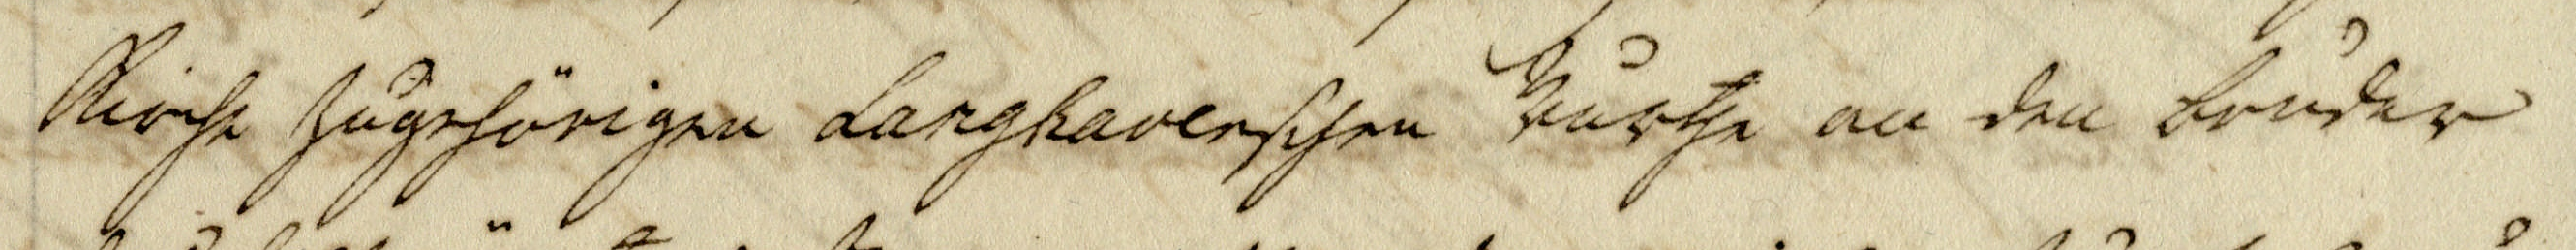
Kirche zugehörigen Langhaverschen Wurthe an den Bruder
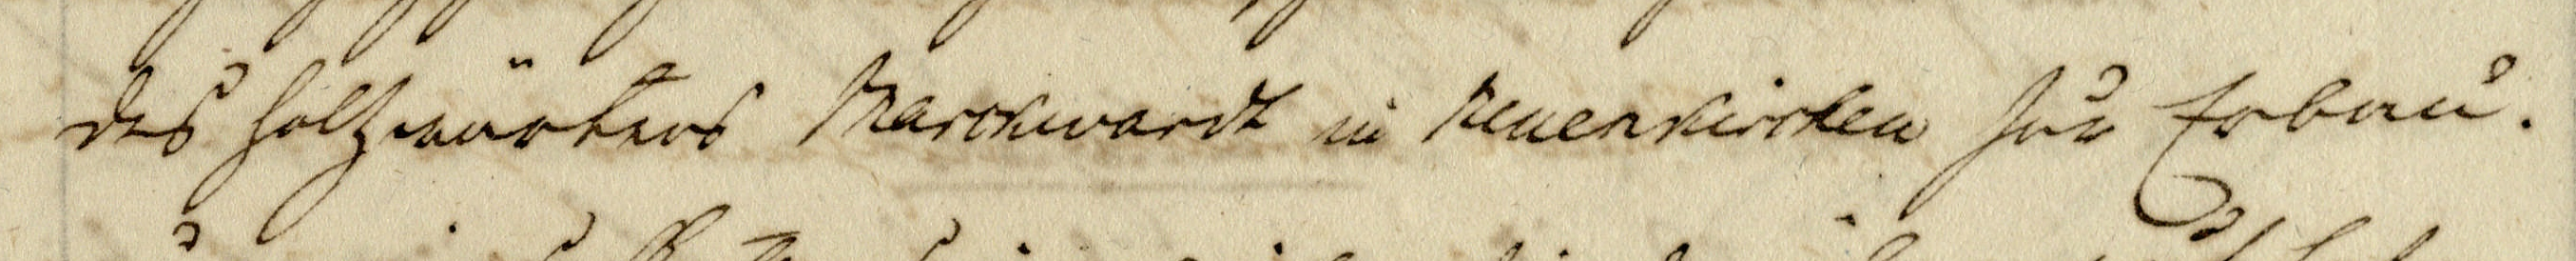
des Holzwärters Marckwardt in Neuenkirchen zur Erbau¬
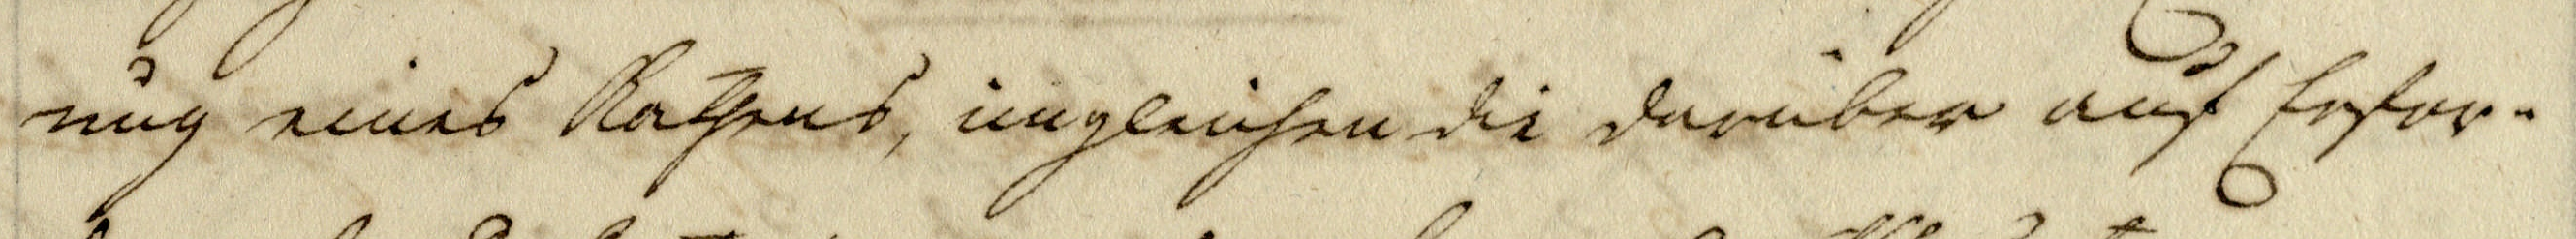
ung eines Kathens, imgleichen die darüber auf Erfor¬
